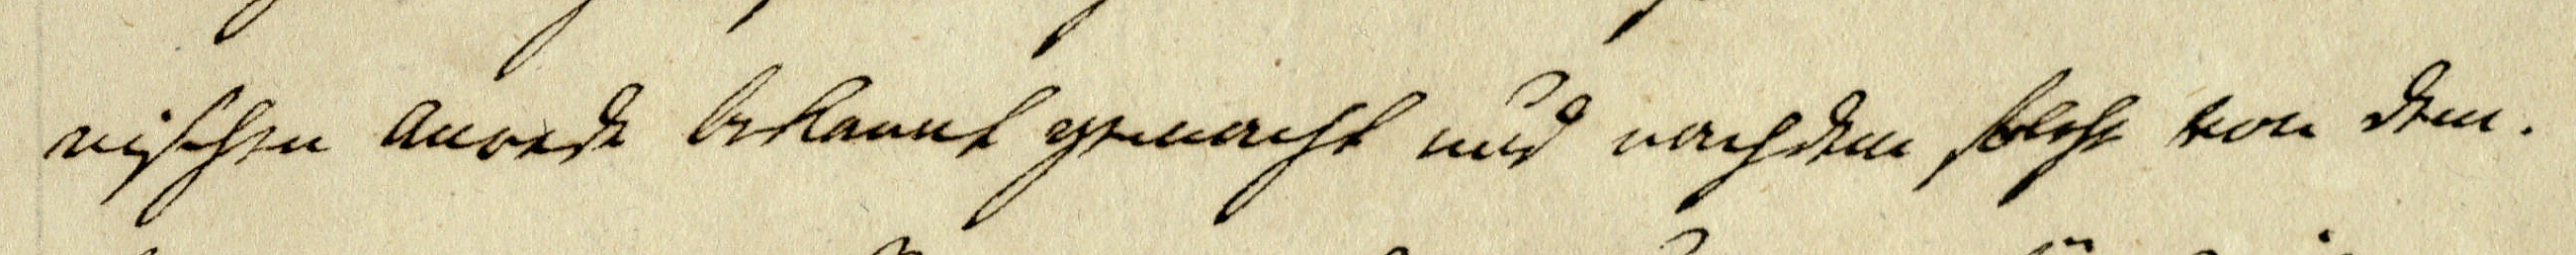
nischen Anrede bekannt gemacht und nachdem solche von dem¬
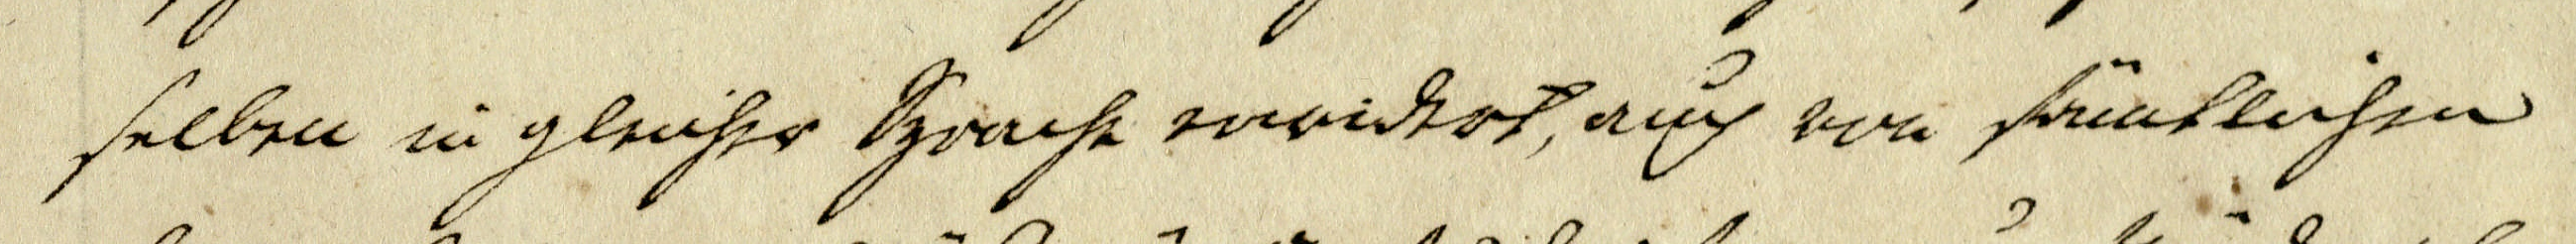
selben in gleicher Sprache erwidert, auch von sämtlichen
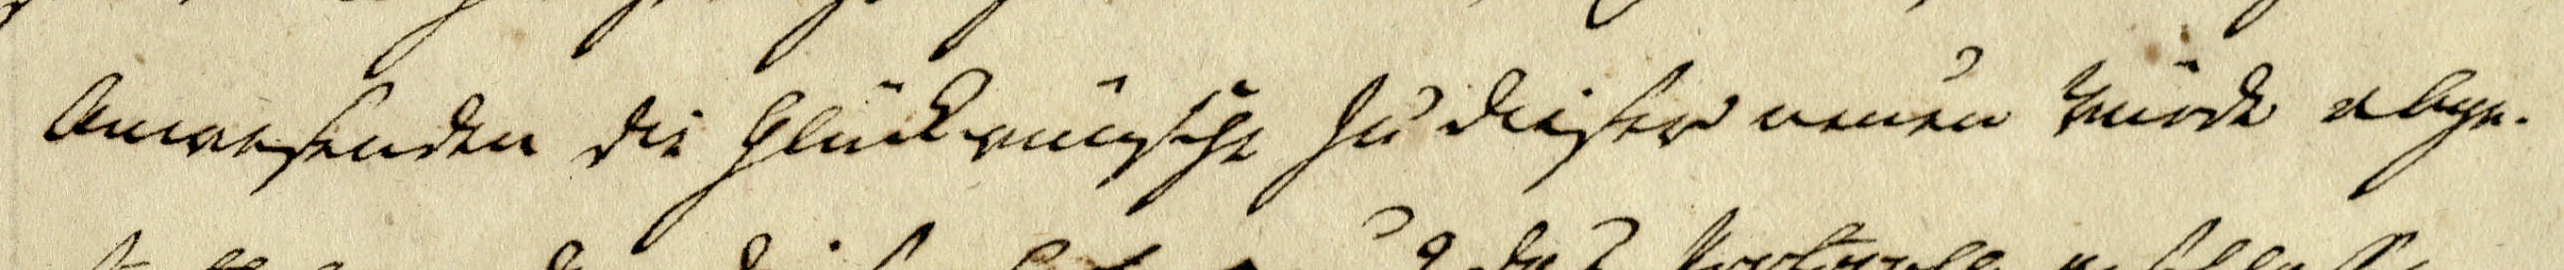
Anwesenden die Glückwünsche zu dieser neuen Würde abge¬
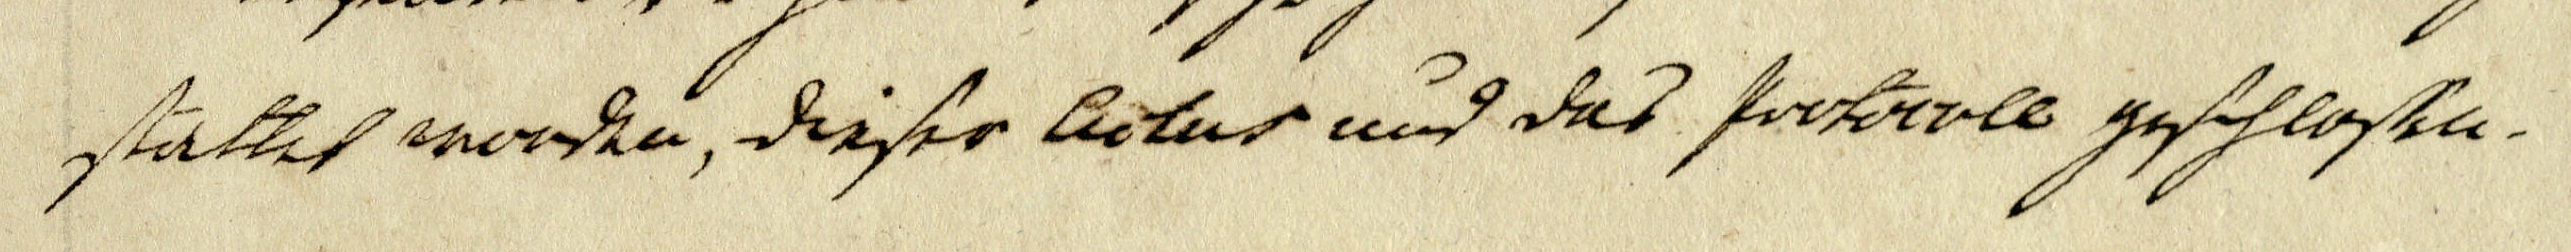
stattet worden, dieser Actus und das Protocoll geschlossen.
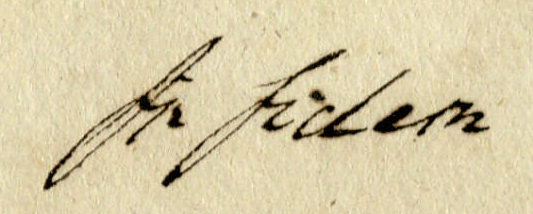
In fidem
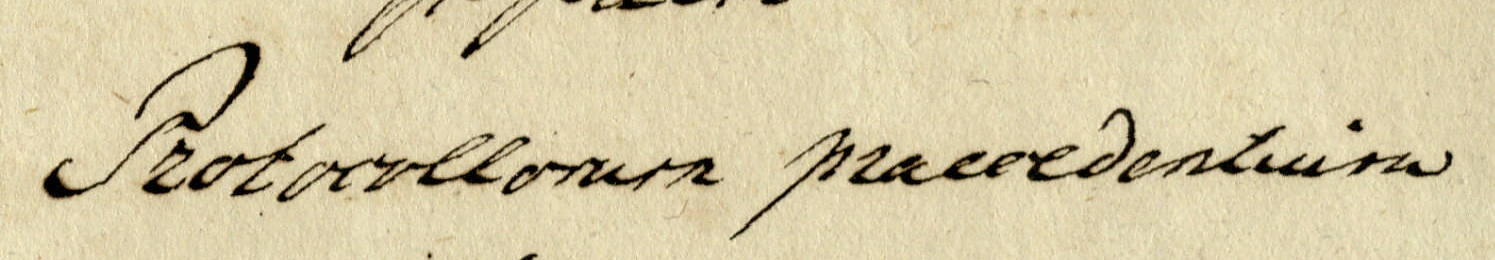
Protocollorum praecedentium
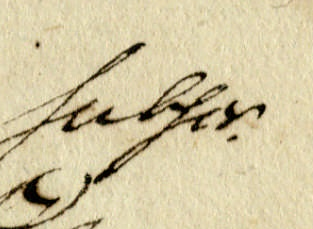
subscr.
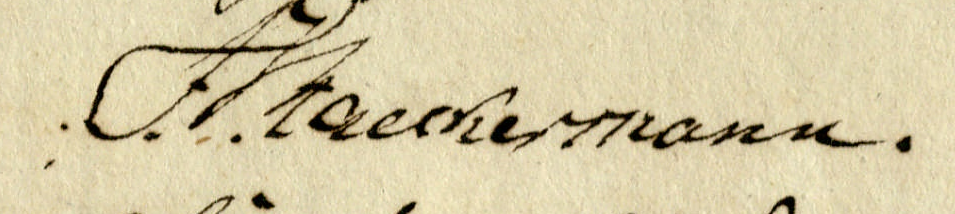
J.G. Haeckermann.
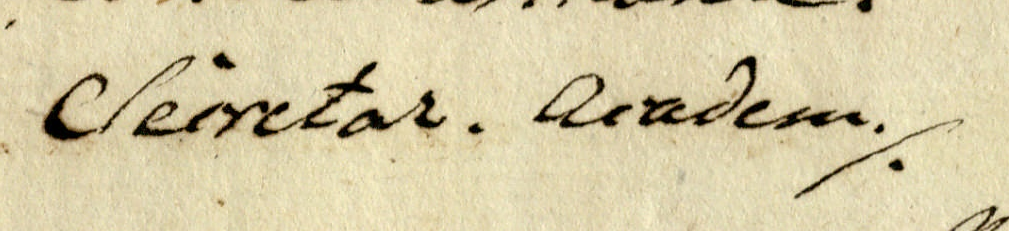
Secretar. Academ.
